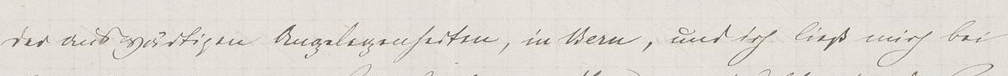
der auswärtigen Angelegenheiten, in Bern, und ich ließ mich bei
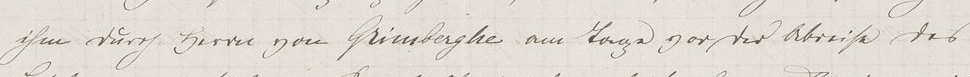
ihm durch Herrn von Grimberghe am Tage vor der Abreise des
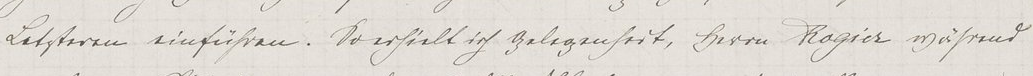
Letzteren einführen. So erhielt ich Gelegenheit, Herrn Rogier während
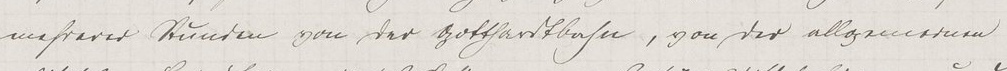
mehrerer Stunden von der Gotthardbahn, von der allgemeinen
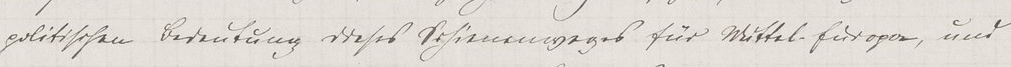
politischen Bedeutung dieses Schienenweges für Mittel- Europa, und
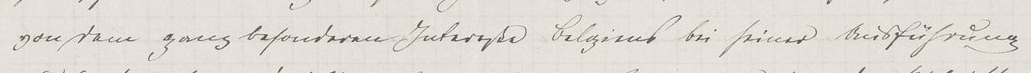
von dem ganz besonderen Intereße Belgiens bei seiner Ausführung
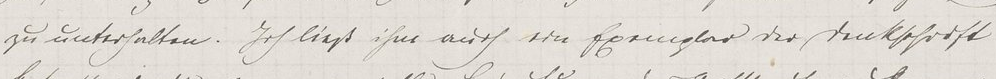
zu unterhalten. Ich ließ ihm auch ein Exemplar der Denkschrift
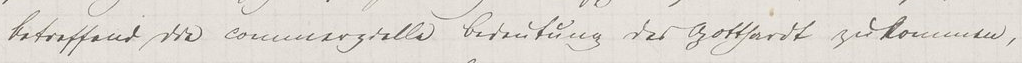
betreffend die commerzielle Bedeutung des Gotthardt zukommen,
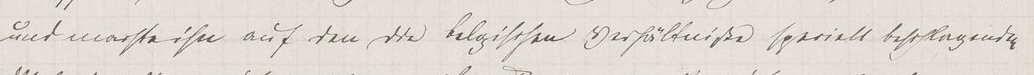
und machte ihn auf den die belgischen Verhältniße speciell beschlagenden
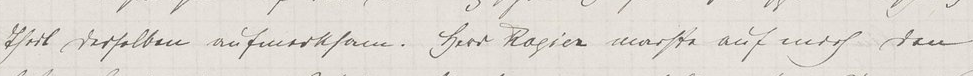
Theil derselben aufmerksam. Herr Rogier machte auf mich den
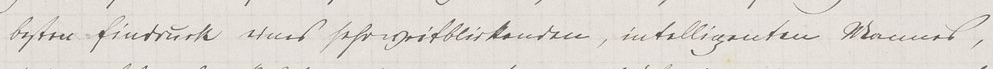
besten Eindruck eines sehr weitblickenden, intelligenten Mannes,
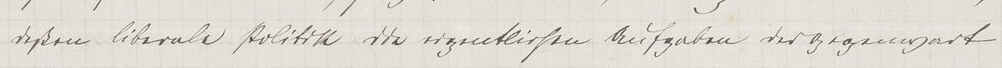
deßen liberale Politik die eigentlichen Aufgaben der Gegenwart
